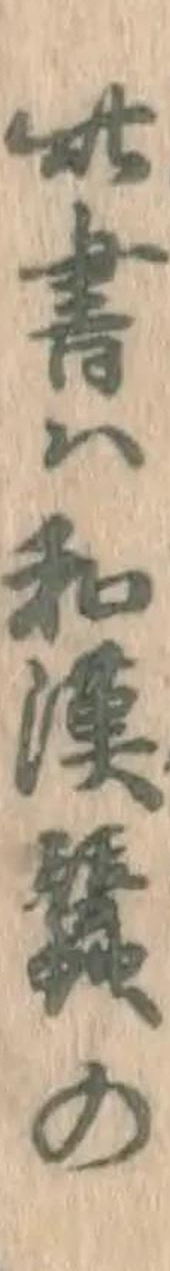此書は和漢蚕の
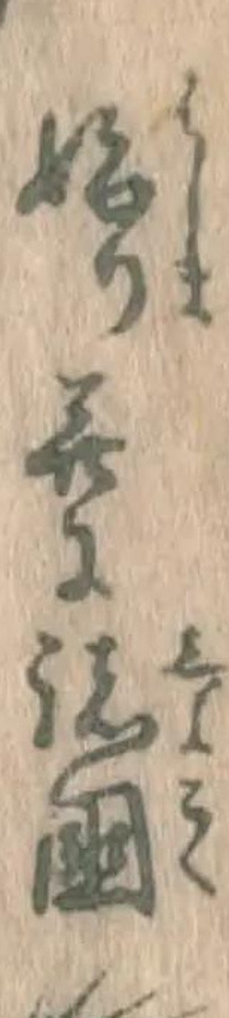始り並に諸国
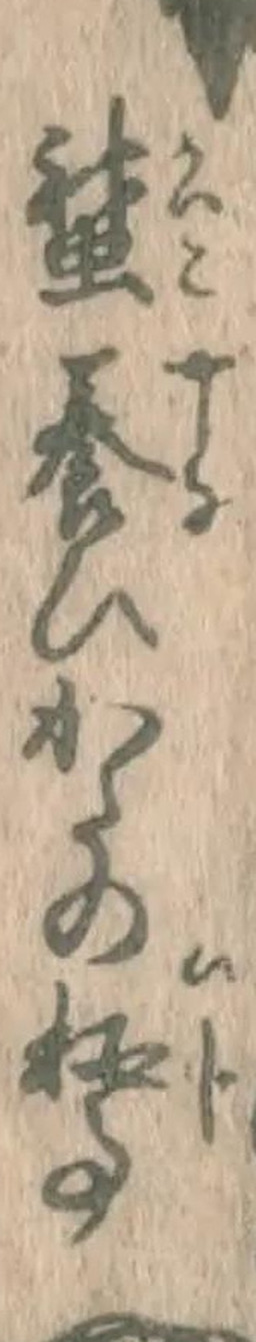蚕養ひかたの秘事
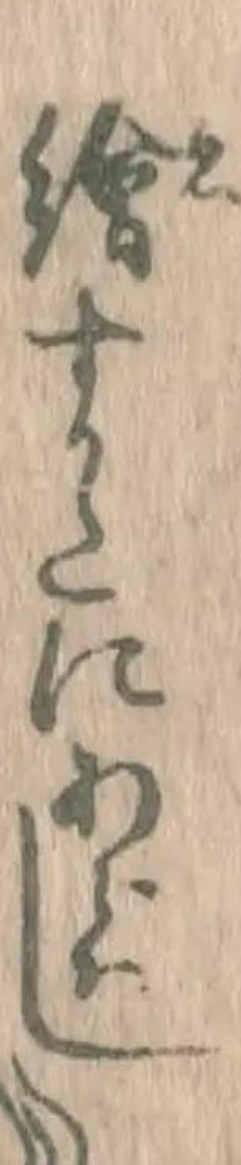絵すかたにあらはし
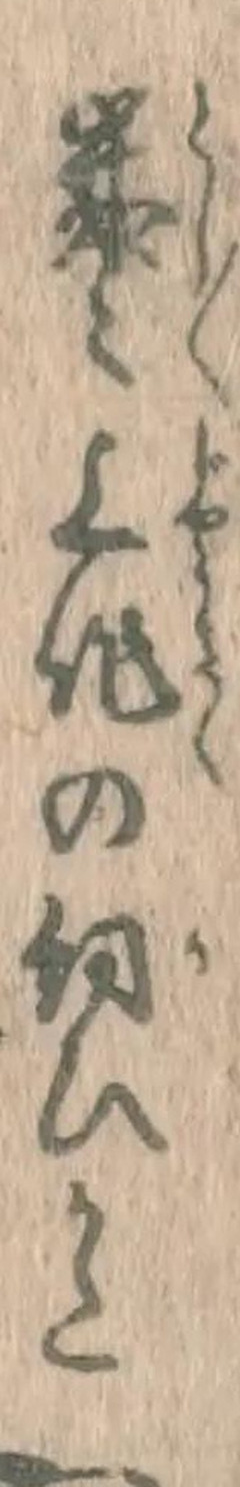歳々上作の飼ひかた
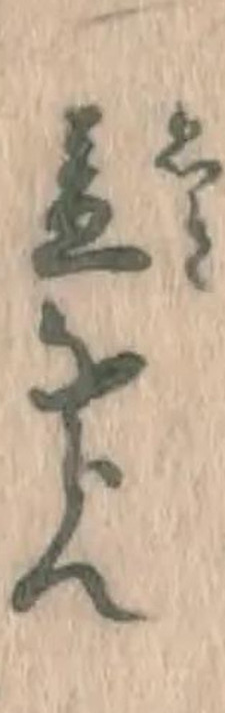益ならん
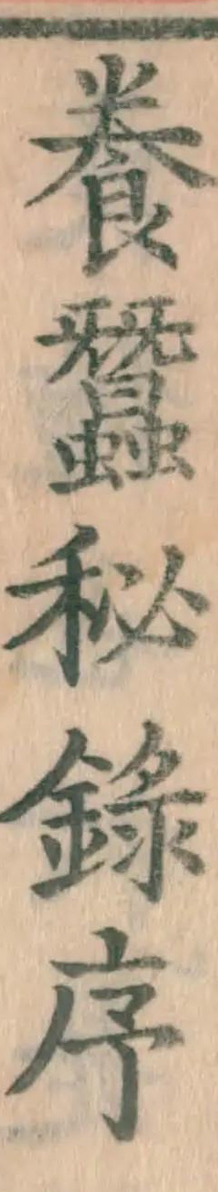養蚕秘録序

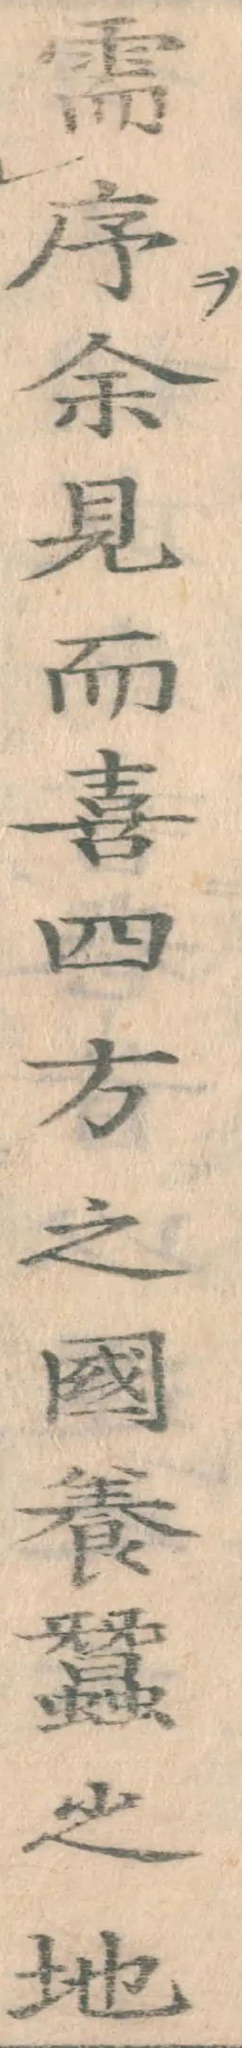需序余見而喜四方之国養蚕之地

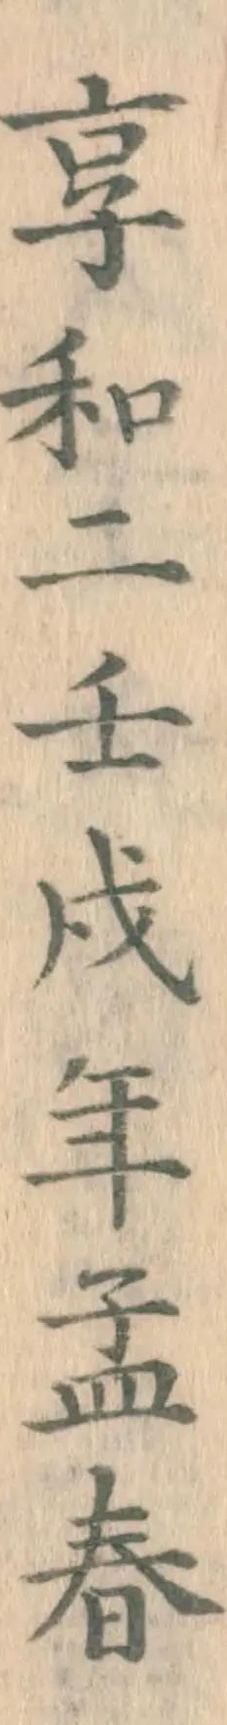享和二壬戌年孟春
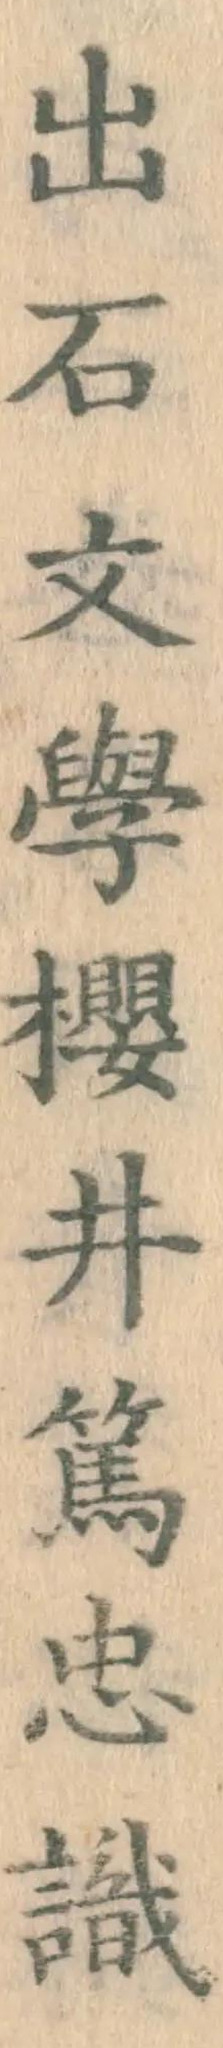出石文学桜井篤忠識
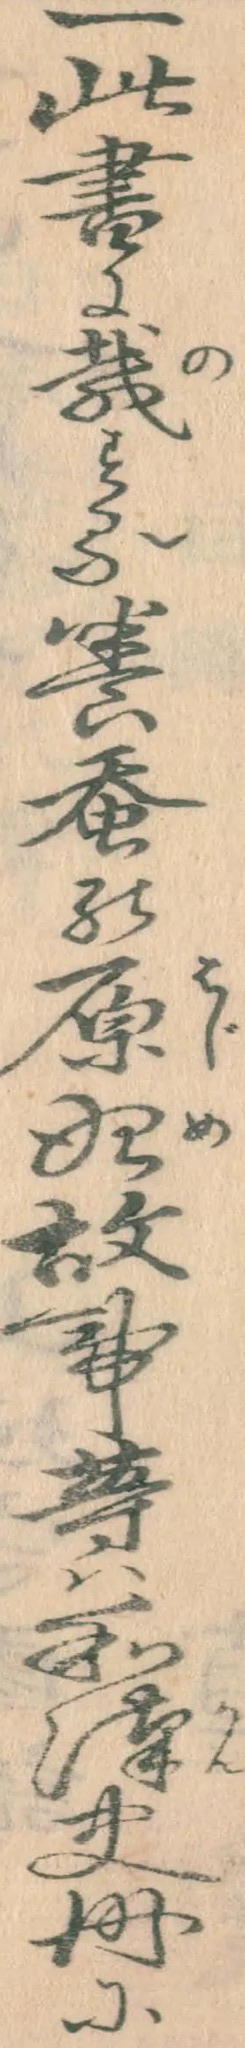一此書に載する養蚕の原始故事等は和漢史冊に
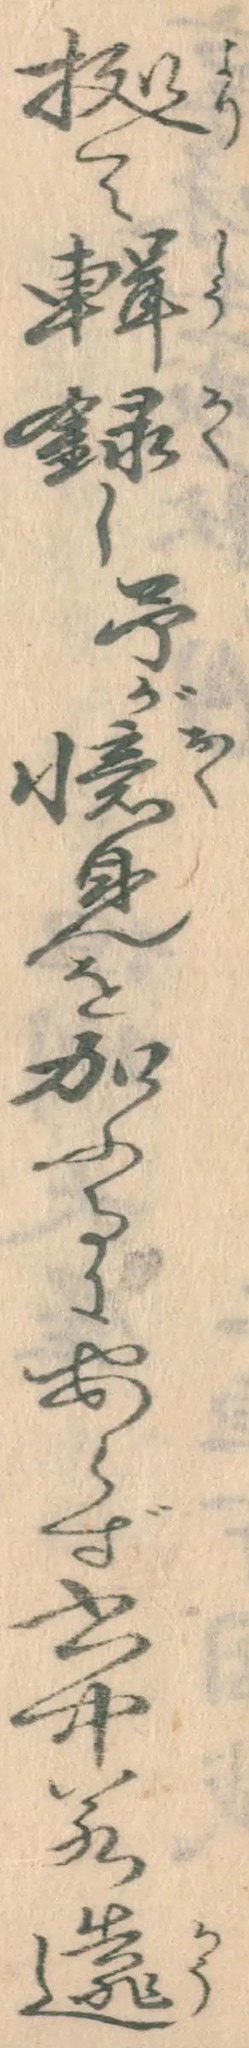拠て輯録し予が憶見を加ふるにあらず書中若𨘴
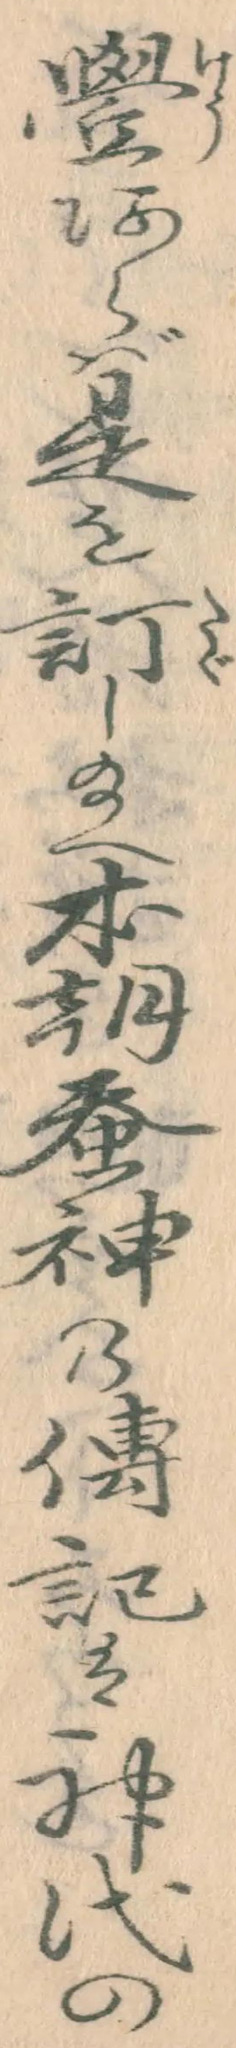あらば是を訂し給へ本朝蚕神の伝記は神代の
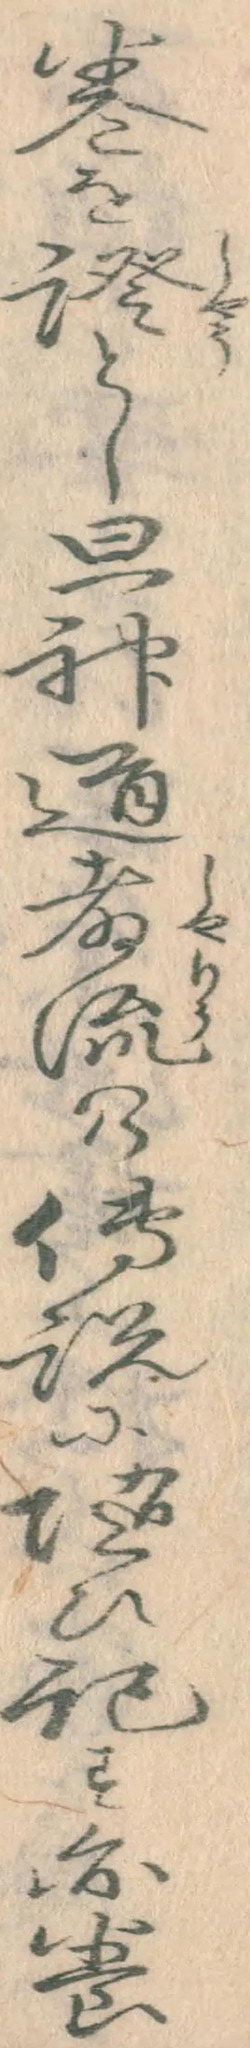巻を證とし旦神道者流の伝説に随ひ記す亦養
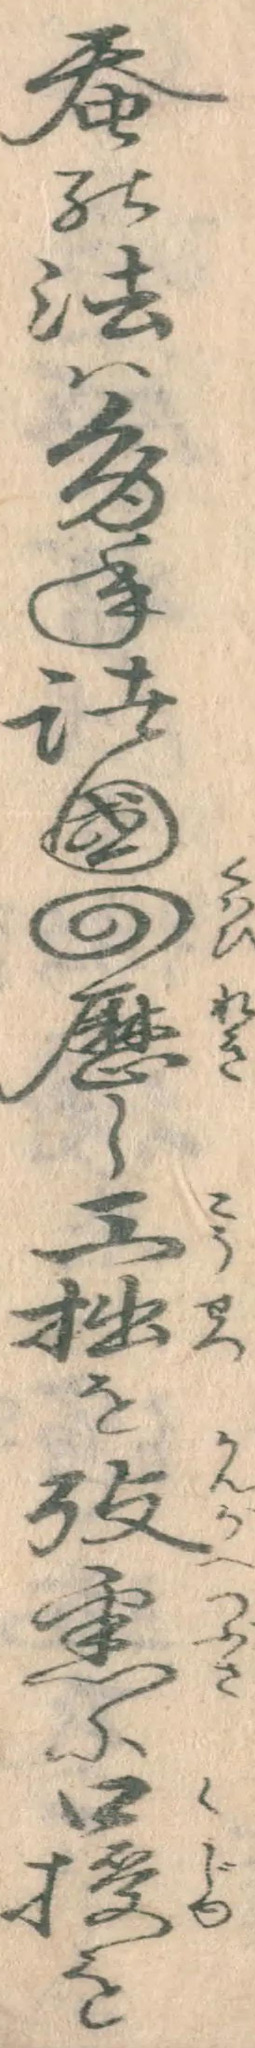蚕の法は多年諸国回歴し工拙を攷悉に口授を
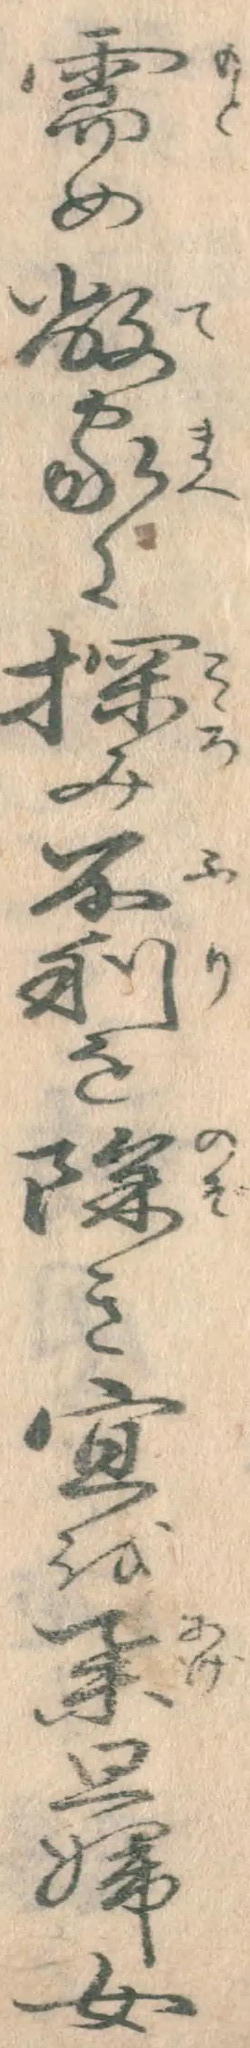需め敝家に探み不利を除き宜を挙且婦女
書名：養蚕秘録 3巻. [1]
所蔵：国立国会図書館 National Diet Library, JAPAN
